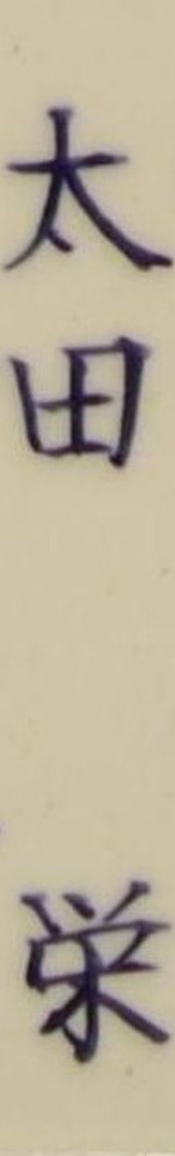太田栄
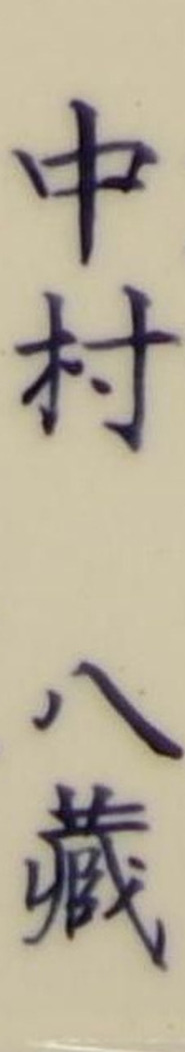中村八蔵
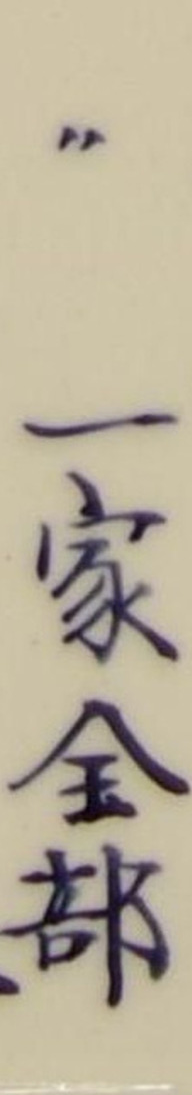一家全部
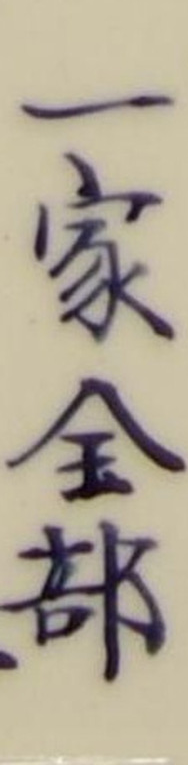一家全部
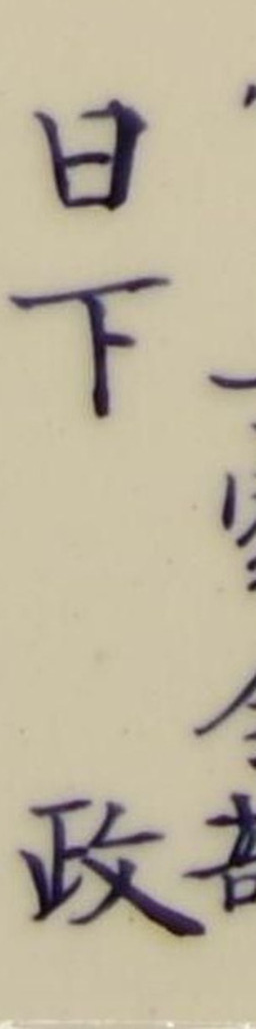日下政
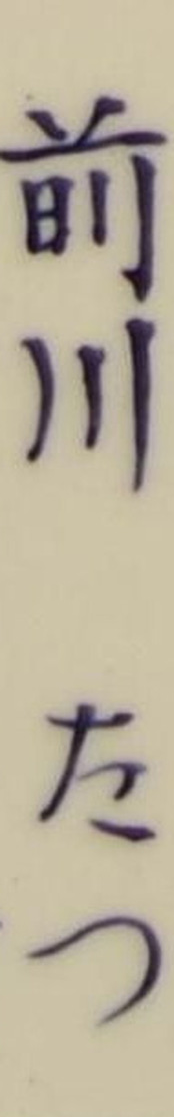前川たつ
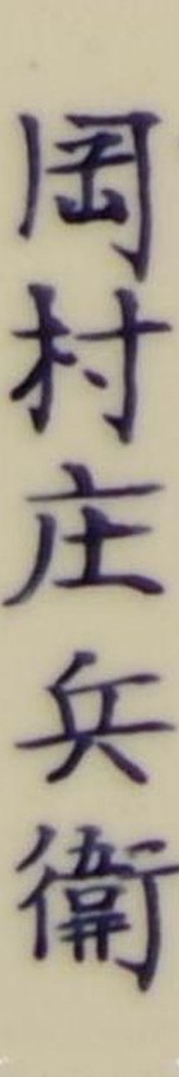岡村庄兵衛
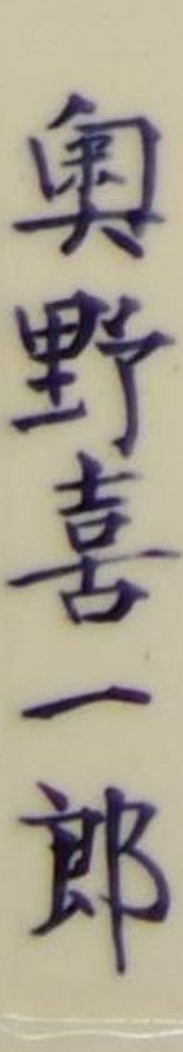奥野喜一郎

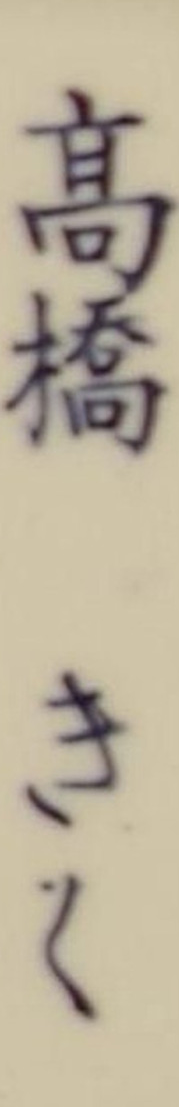高橋きく
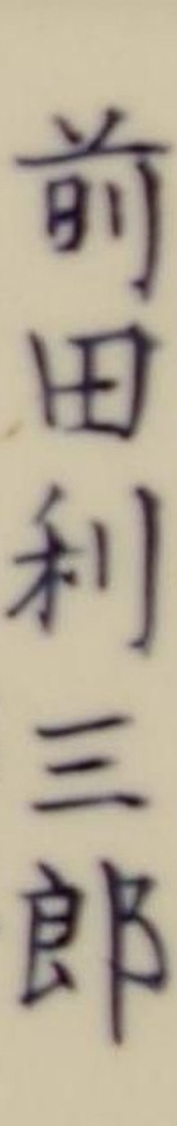前田利三郎
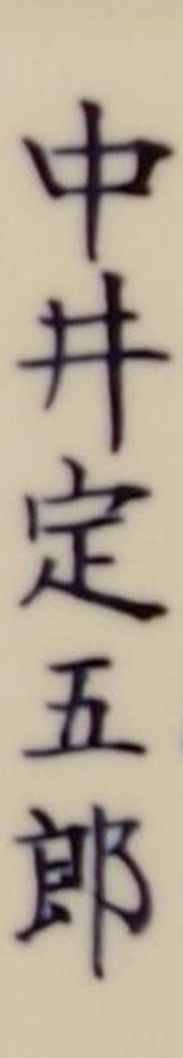中井定五郎
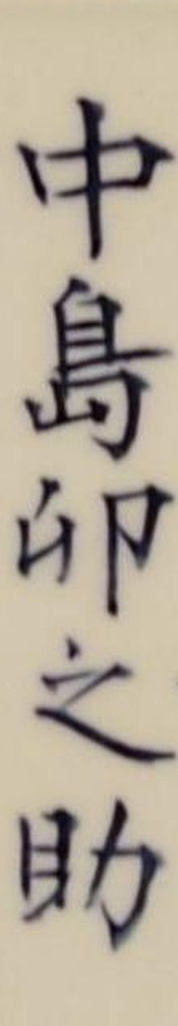中島卯之助
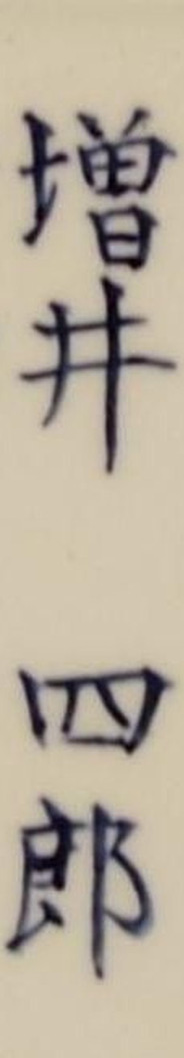増井四郎
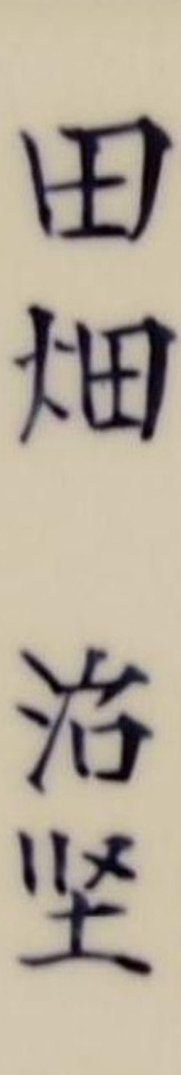田畑治堅
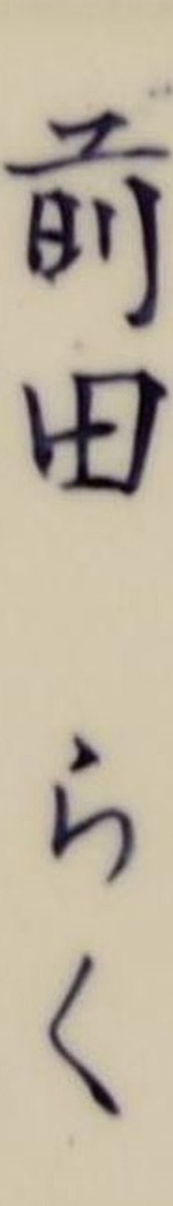前田らく
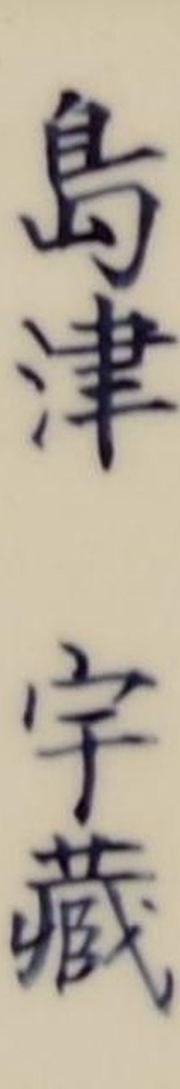島津宇蔵
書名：A~D
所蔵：koyasan kongobuji
